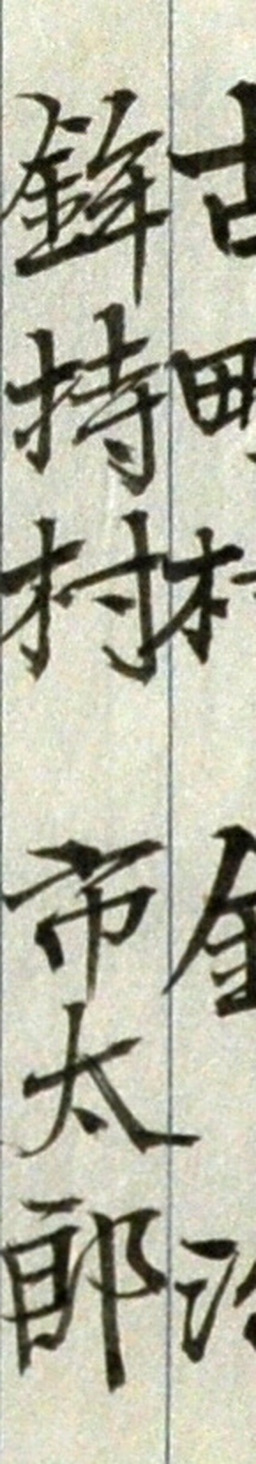鉾持村市太郎
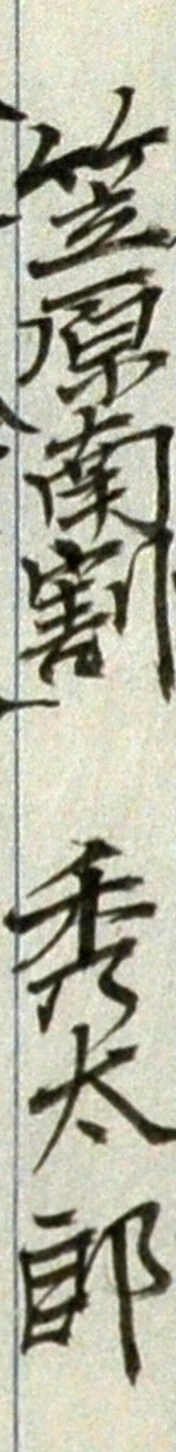笠原南割秀太郎
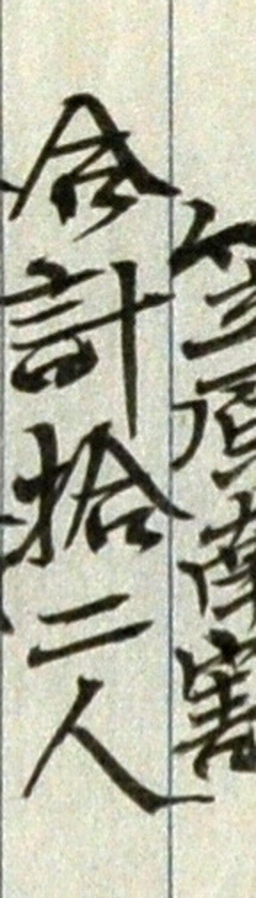合計拾二人
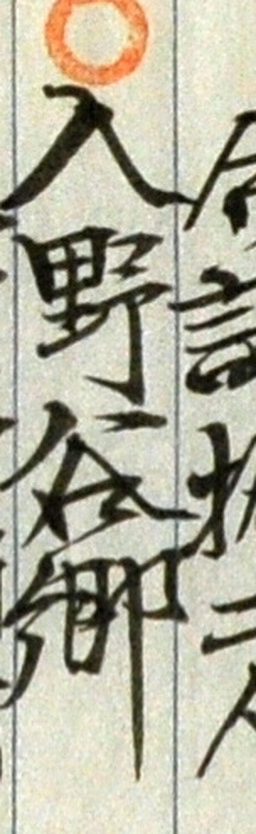〇入野谷郷
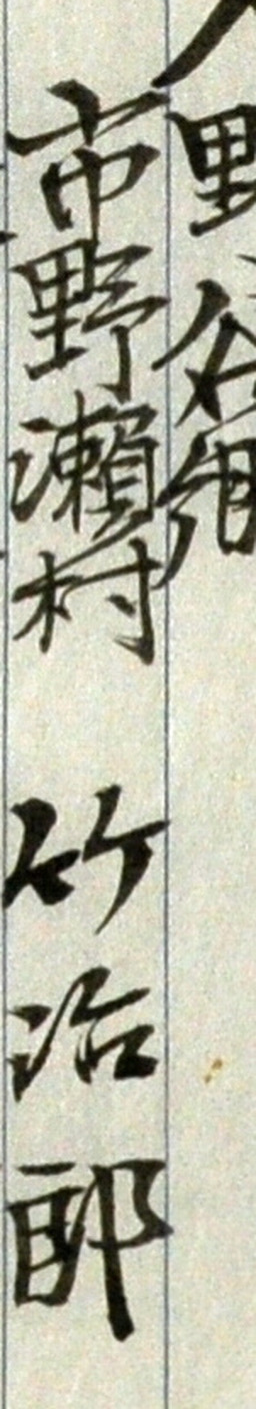市野瀬村竹治郎
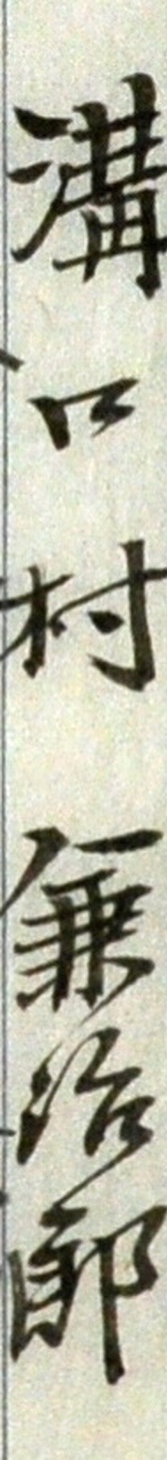溝口村兼治郎
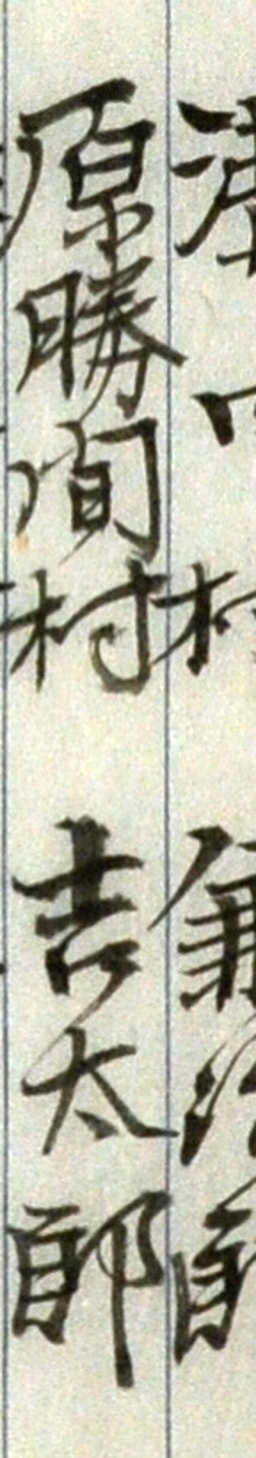原勝間村吉太郎
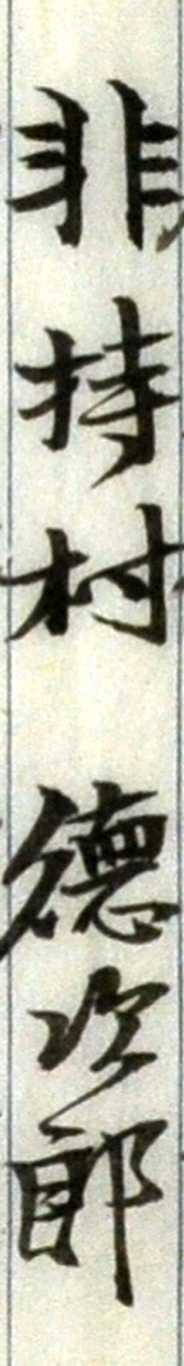非持村徳次郎
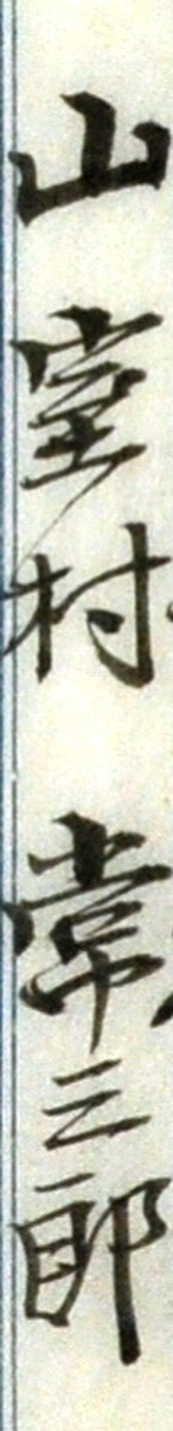山室村常三郎
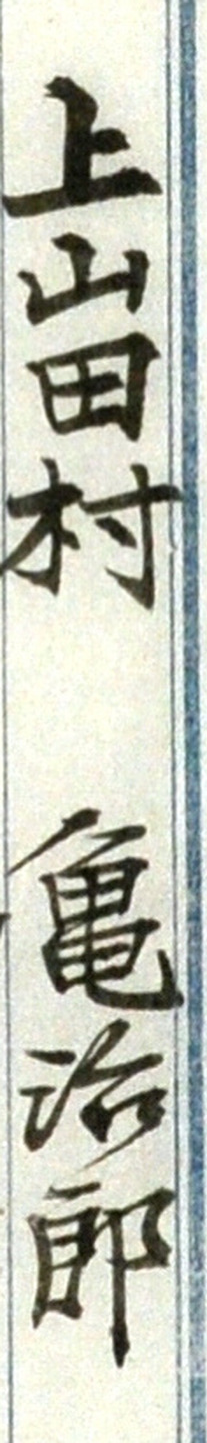上山田村亀治郎
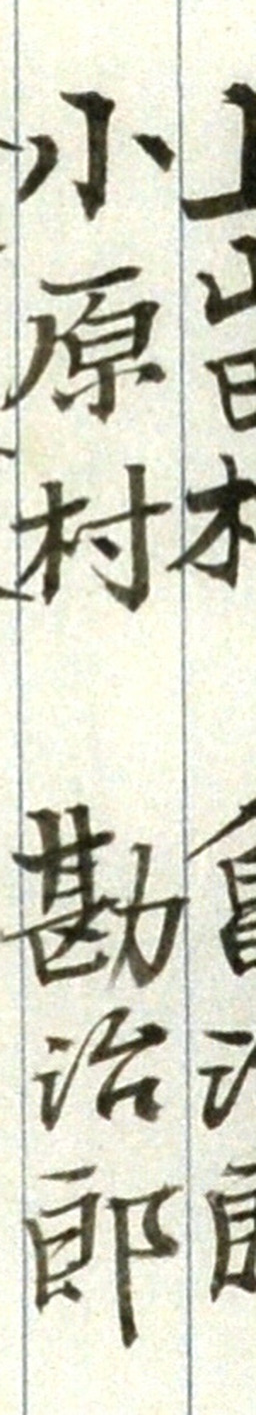小原村勘治郎
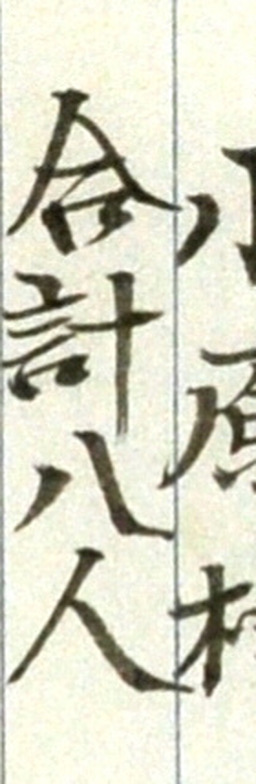合計八人

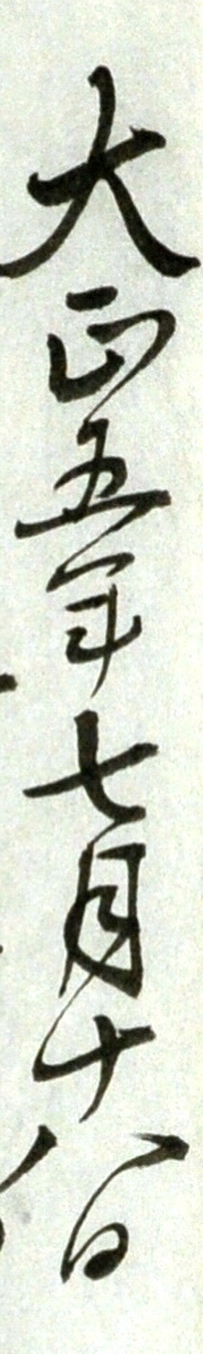大正五年七月十八日
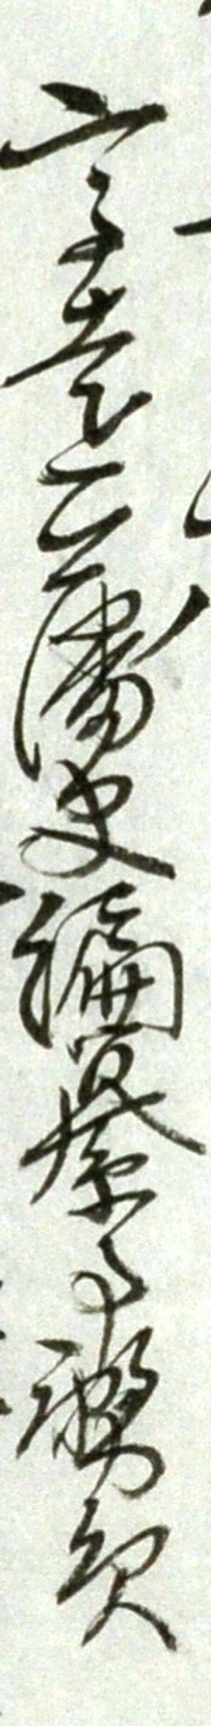高遠藩史編纂事務員
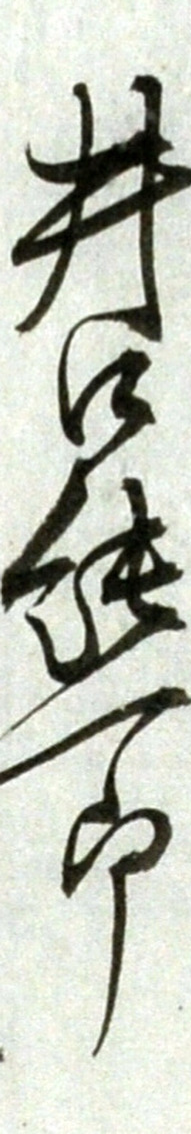井口純一郎
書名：高遠藩兵員名簿歩兵銃隊・郷村募集員
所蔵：伊那市立高遠町図書館・合同会社AMANE
